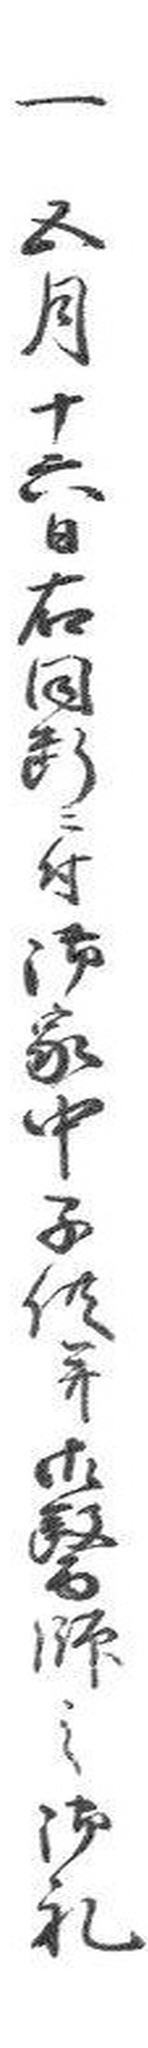一五月十六日右同断ニ付御家中子供幷御医師之御礼
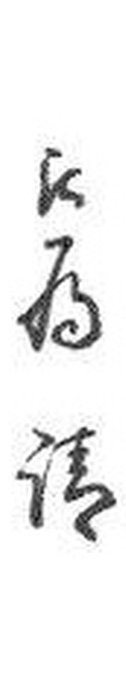被為請
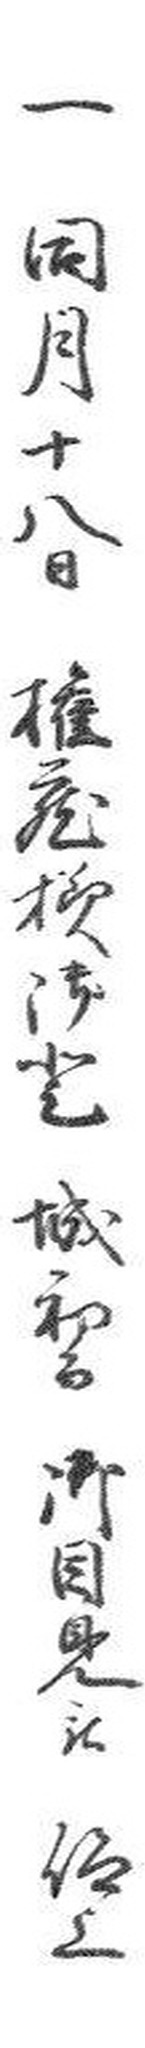一同月十八日権蔵様御登城初而御目見被仰上
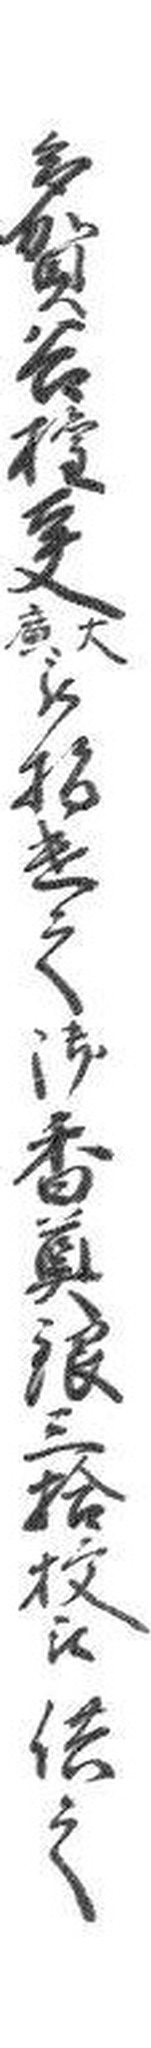多賀谷権大夫大広被指遣之御香奠銀三拾枚被供之
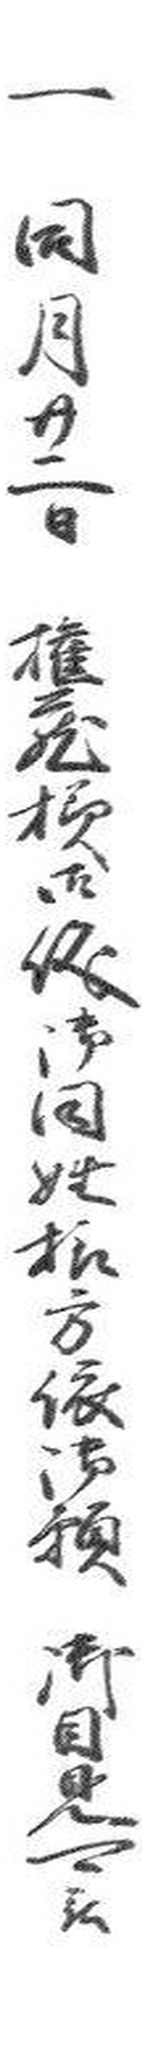一同月廿二日権蔵様御儀御同姓様方依御願御目見可被
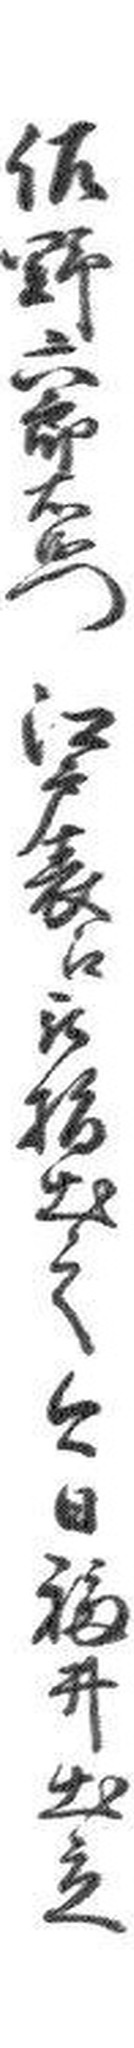佐野六郎右衛門江戸表江被指出之今日福井出立
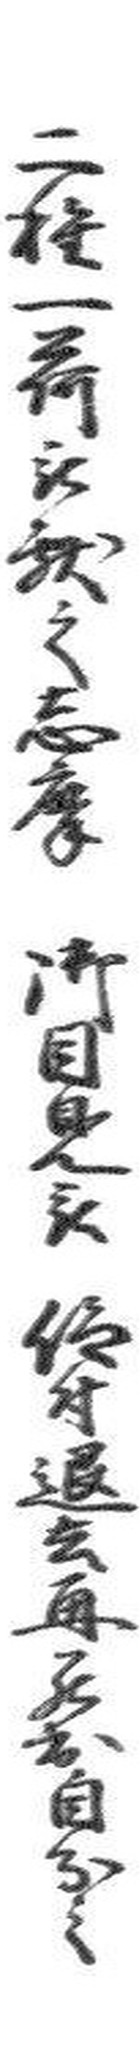二種一荷被献之志摩御目見被仰付退去再罷出自分之
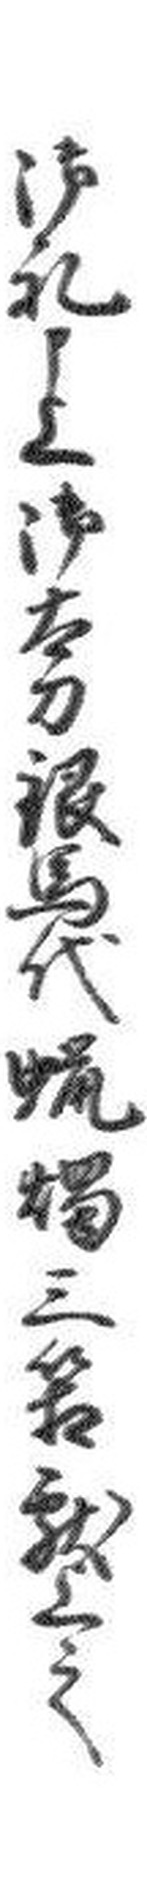御礼申上御太刀銀馬代蝋燭三箱献上之
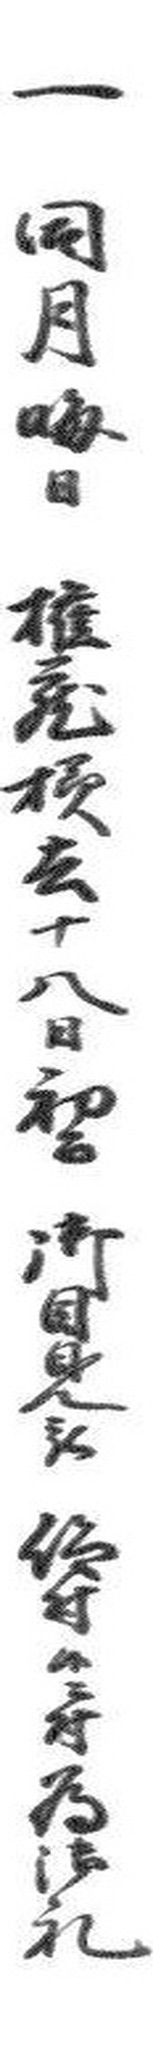一同月晦日権蔵様去十八日初而御目見被仰付候ニ付為御礼
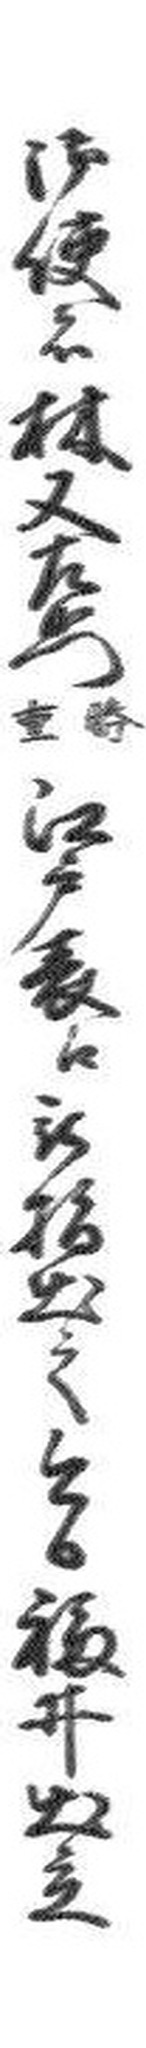御使者林又左衛門勝重江戸表江被指出之今日福井出立
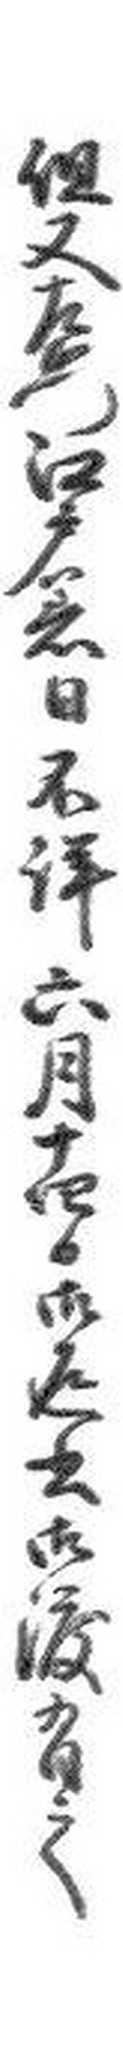但又左衛門江戸着日不詳六月十四日御返書御渡有之

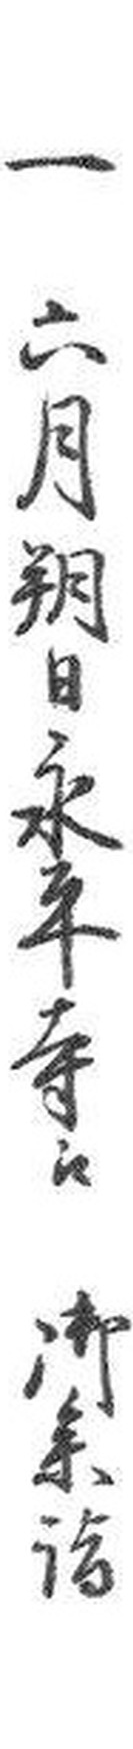一六月朔日永平寺江御参詣
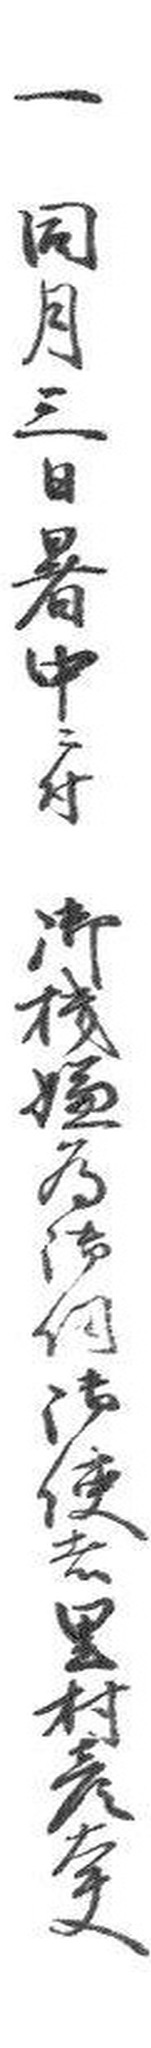一同月三日暑中ニ付御機嫌為御伺御使者里村彦太夫
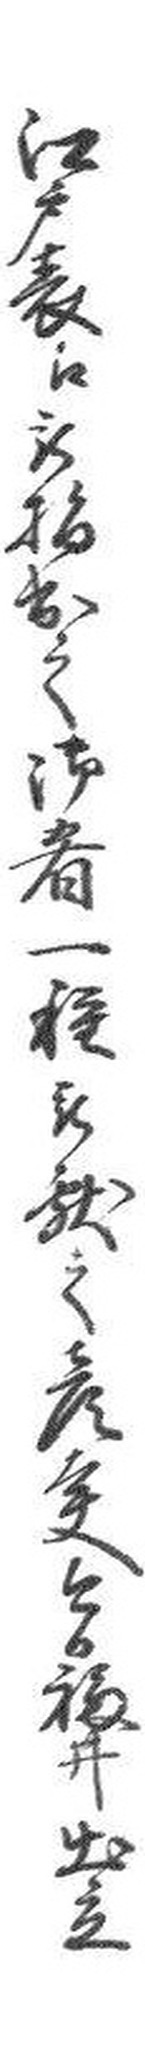江戸表江被指出之御肴一種被献之彦太夫今日福井出立
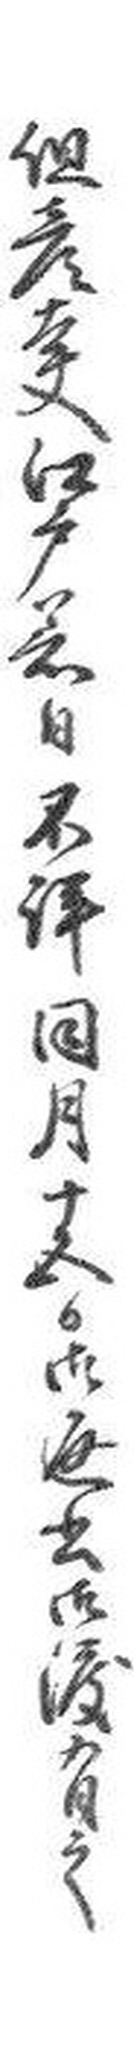但彦太夫江戸着日不詳同月十五日御返書御渡有之
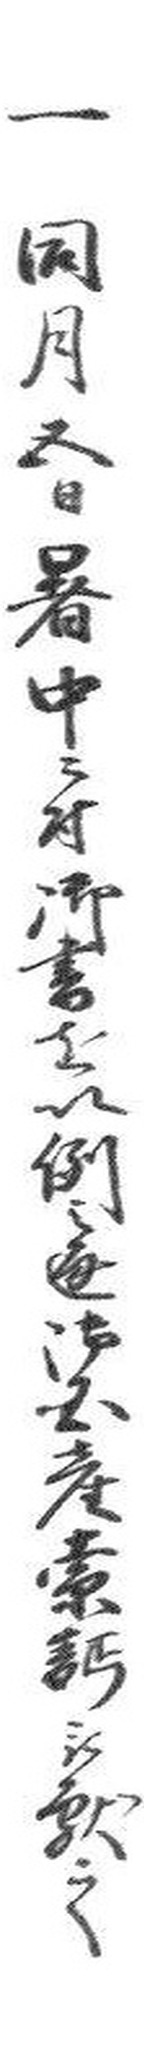一同月五日暑中ニ付御書を以例之通御国産索麪被献之
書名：家譜 十一 昌親公 従延宝二年到延宝四年八月
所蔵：福井県文書館 Fukui Prefectural Archives
